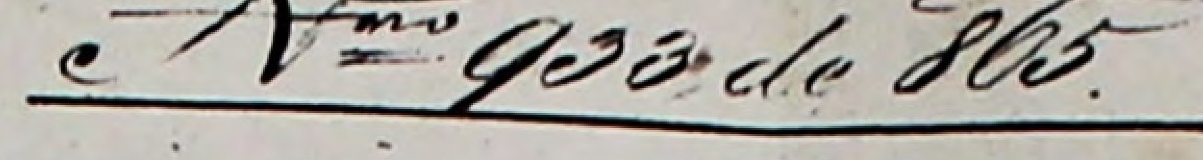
Nmo 933 de 865.
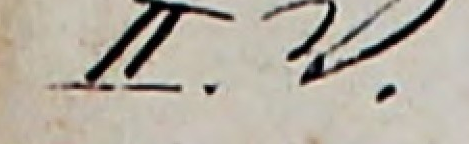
II. V.
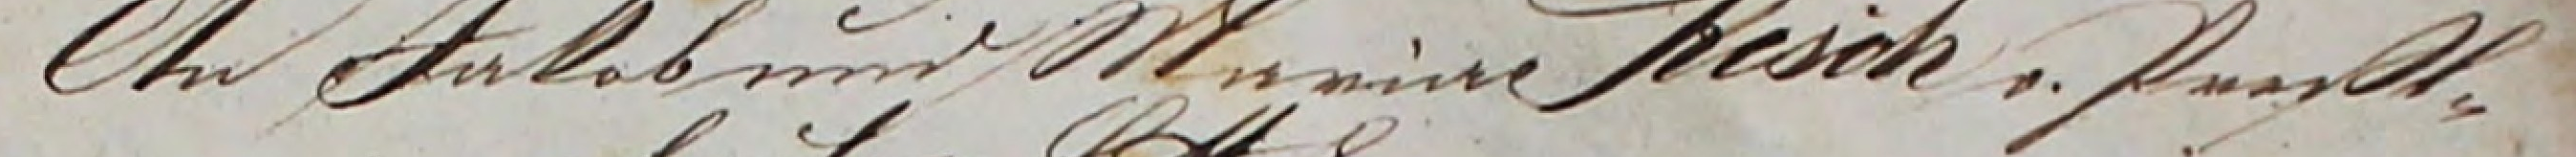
An Jakob und Maria Resch v. Preßl„
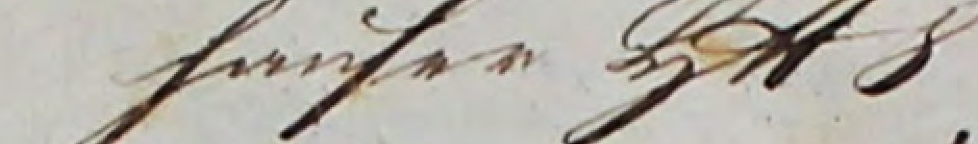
hauser Htt 8
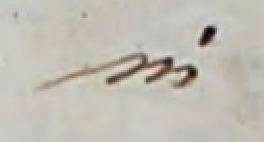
in
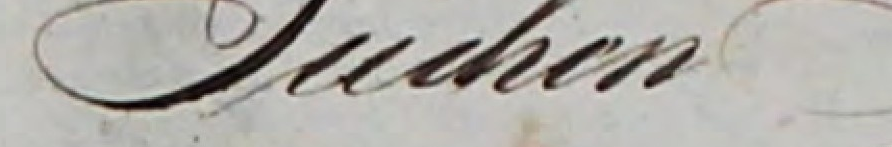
Puchen
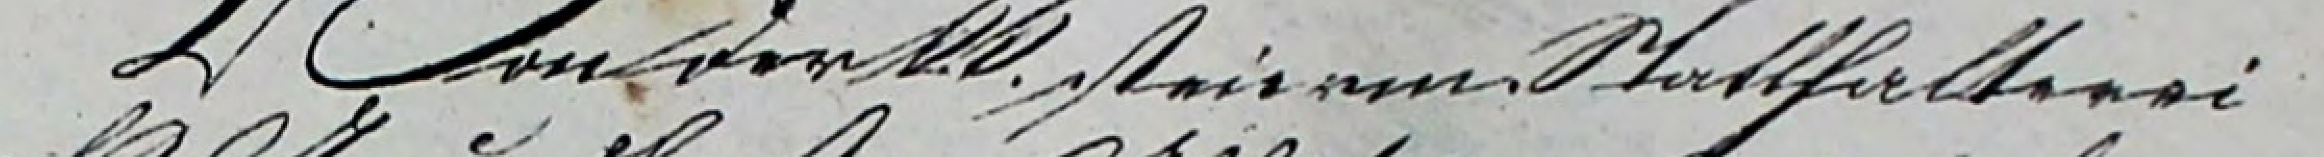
Von der kk. steie??? Statthalterei
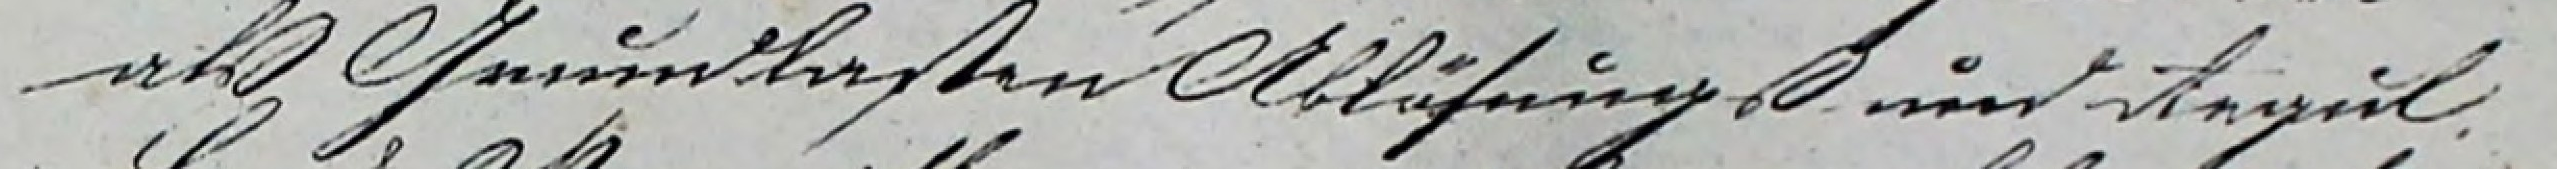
als Grundlasten Ablösungs und Regul.
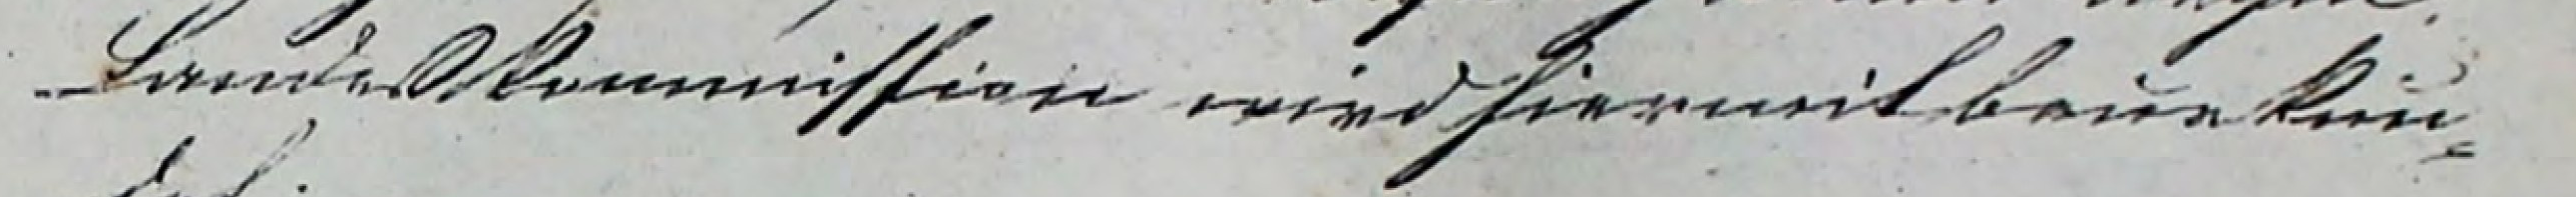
Landeskommission wird hiermit bauekun„
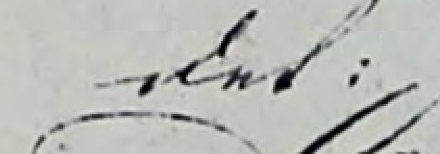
det:
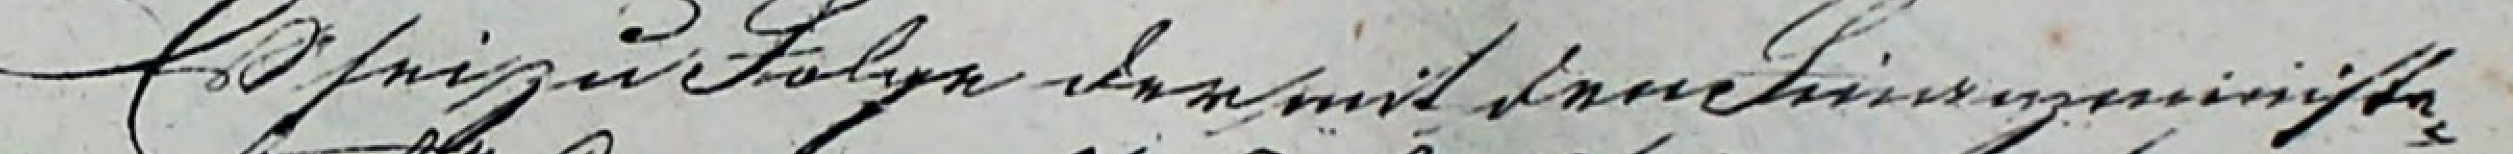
Es sei zu Folge der mit den Finanzministe„
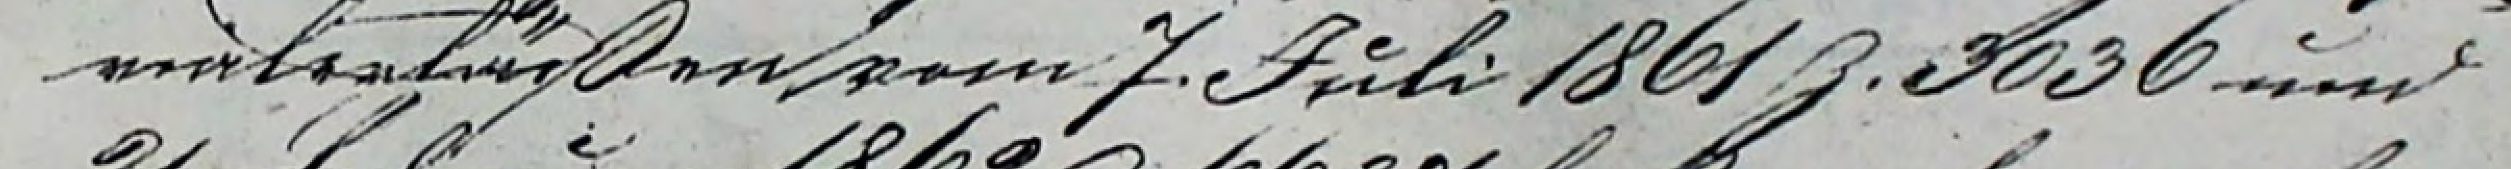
rialer für den vom 7. Juli 1861 z. 3036 und
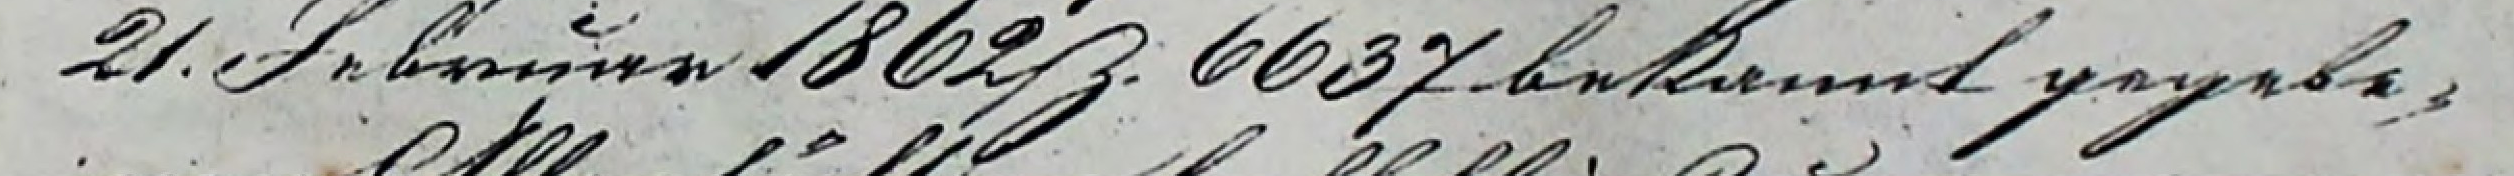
21. Februar 1862 Z. 6637 bekannt gegebe„
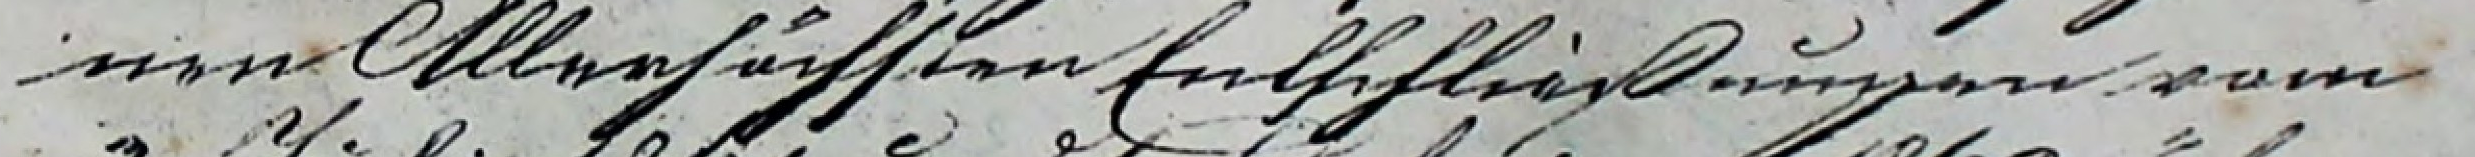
nen Allerhöchsten Entschließungen vom
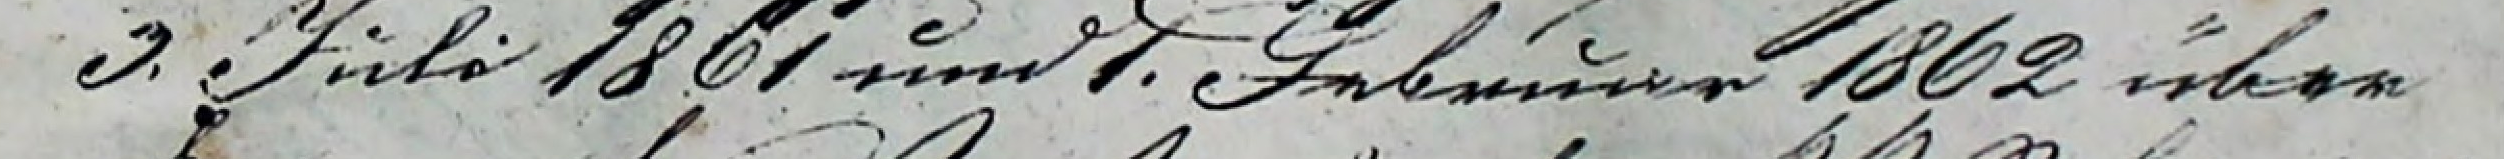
3. Juli 1861 um 1. Februar 1862 über
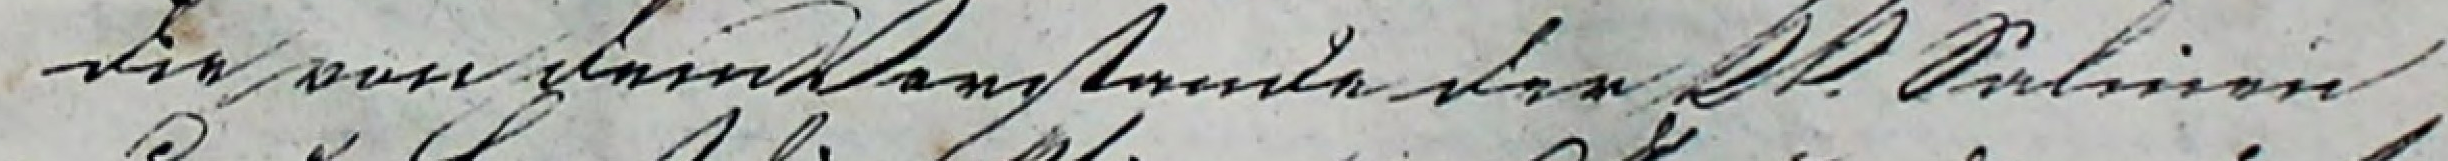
die von dem Verstande der kk. Salinen
